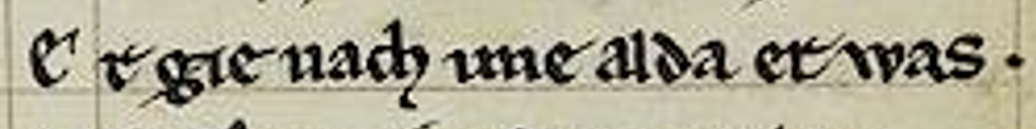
Er gie nach ime alda er was.
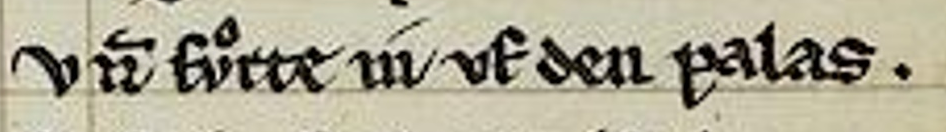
Vn(d) fv°orte in vf den palas.
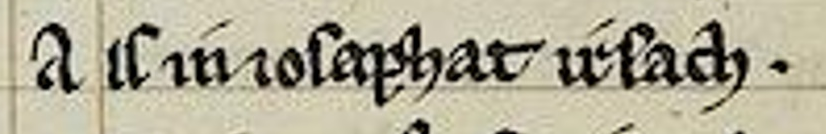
Alſ in ioſaphat irſach.
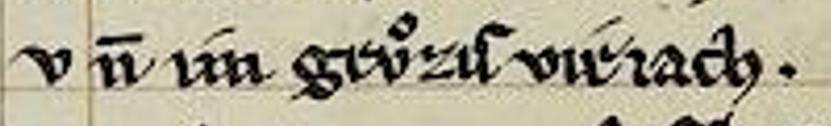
Vn(d) im grv°oziſ viriach.
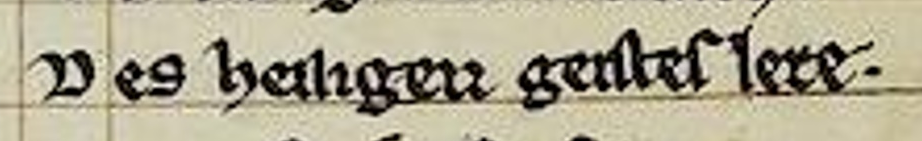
Des heiligen geiſteſ lere.
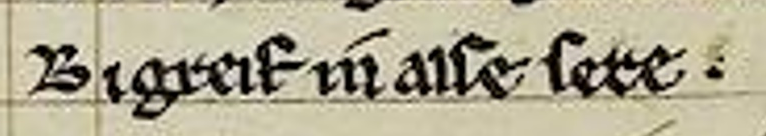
Bigreif in alſe ſere.
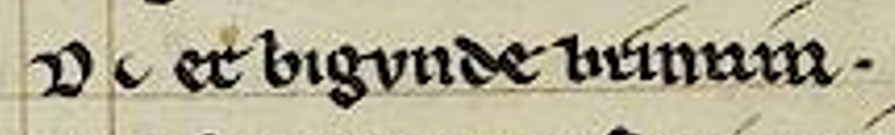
D(az) er bigvnde brinnin.
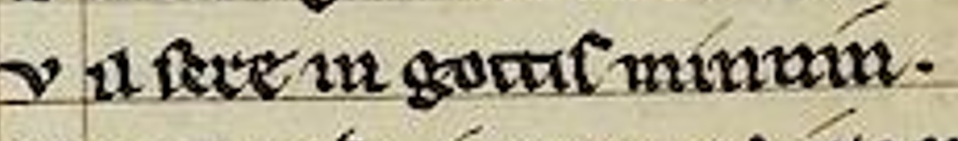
Vil ſere in gottiſ minnin.
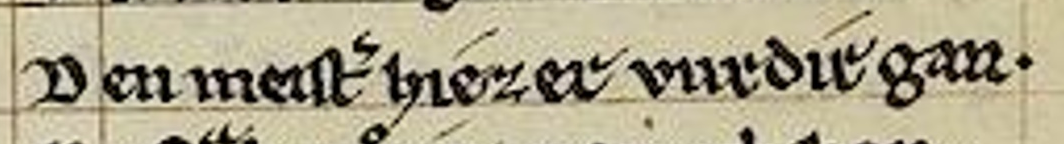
Den meiſt(er) hiez er vurdir gan.
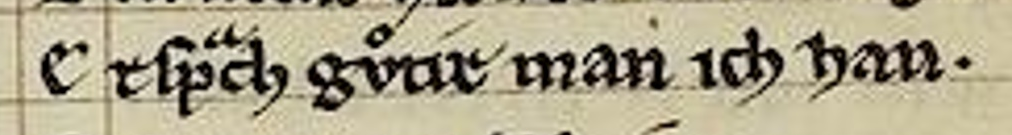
Erſp(ra)ch gv°otir man ich han.
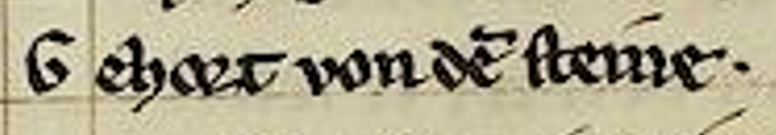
Gehort von de(m) ſteine.
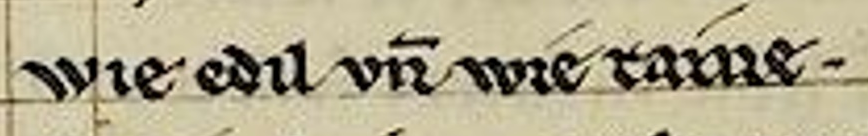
Wie edil vn(d) wie raine.
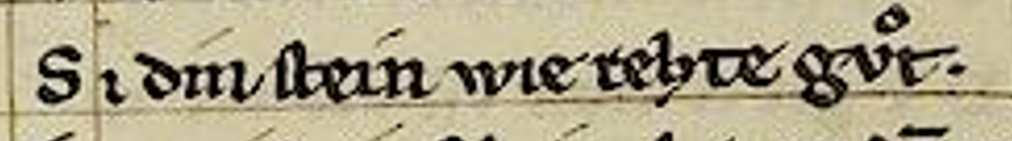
Si din ſtein wie rehte gv°ot.
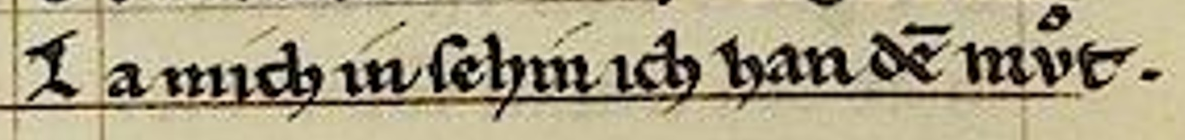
La mich in ſehin ich han de(n) mv°ot.
